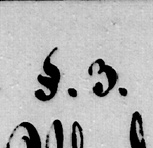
§. 3.
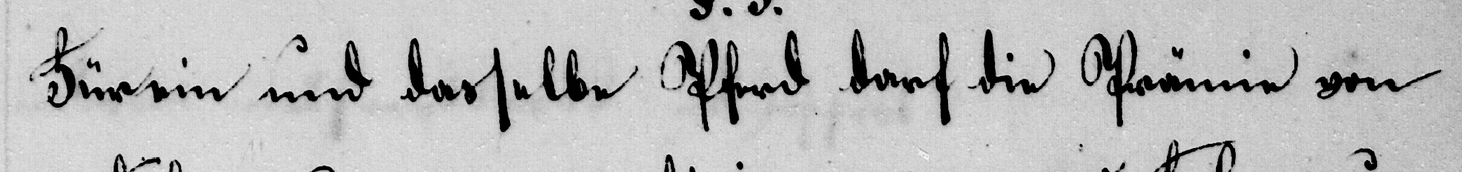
Für ein und dasselbe Pferd darf die Prämie von
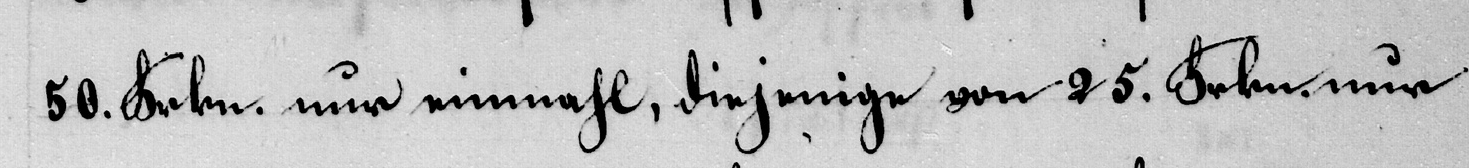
50. Frkn. nur einmahl, diejenige von 25. Frkn. nur
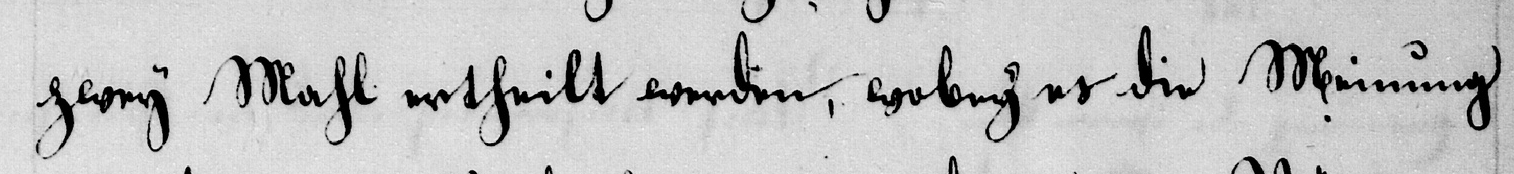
zwey Mahl ertheilt werden, wobey es die Meinung
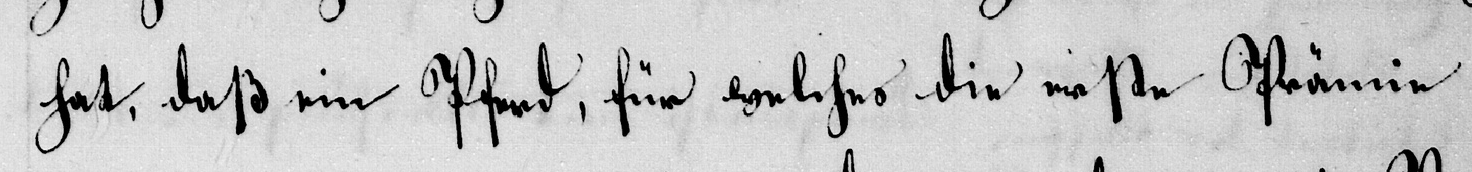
hat, daß ein Pferd, für welches die erste Prämie
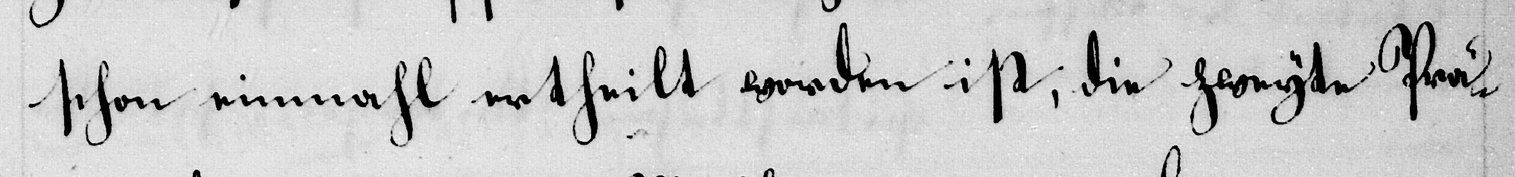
schon einmahl ertheilt worden ist, die zweyte Prä¬
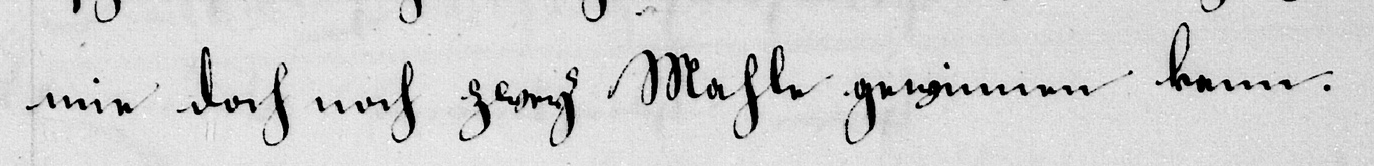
mie doch noch zwey Mahle gewinnen kann.
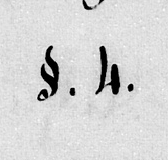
§. 4.
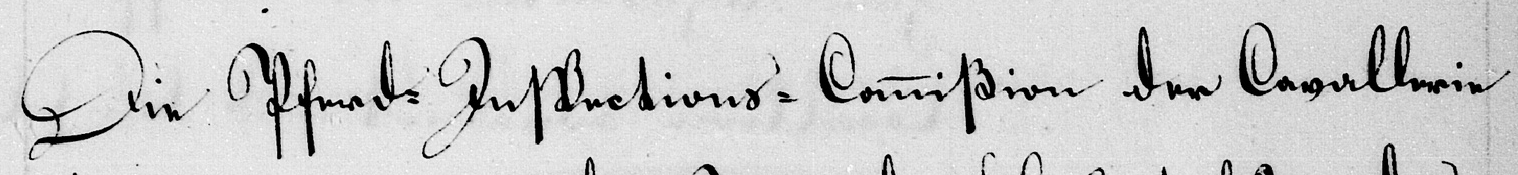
Die Pferd-Inspections-Commißion der Cavallerie
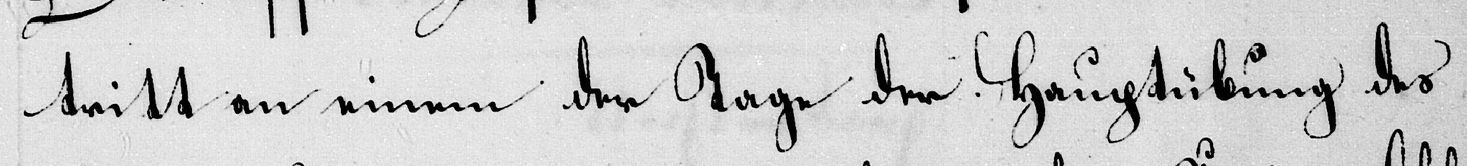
tritt an einem der Tage der Hauptübung des
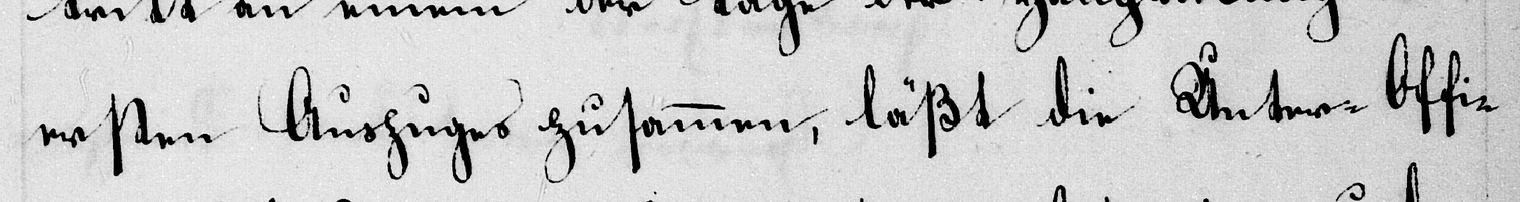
ersten Auszuges zusammen, läßt die Unter-Offi¬
